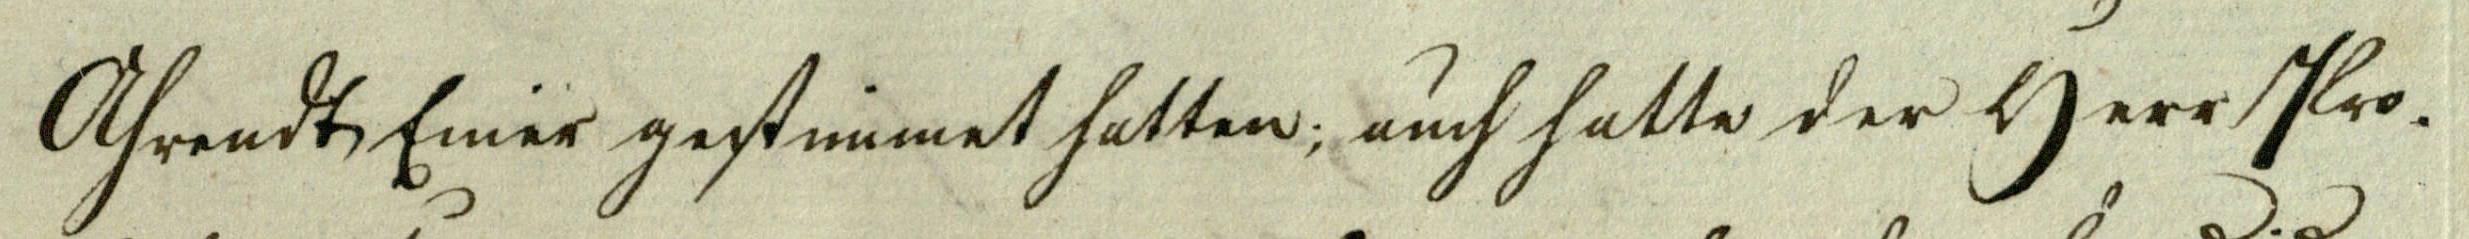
Ahrendt Einer gestimmt hatten; auch hatte der Herr Prof¬
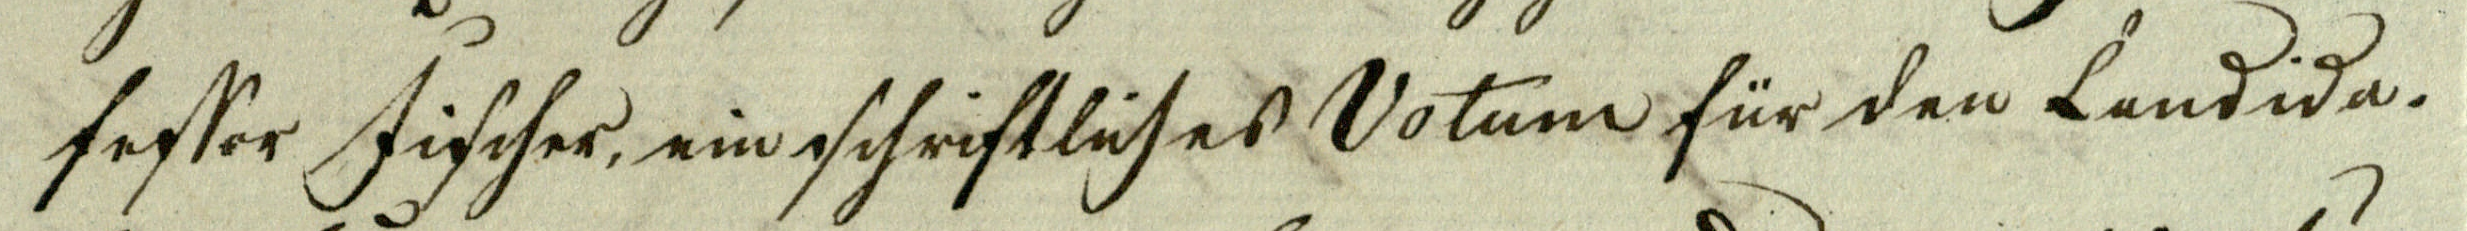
fessor Fischer, ein schriftliches Votum für den Candida¬
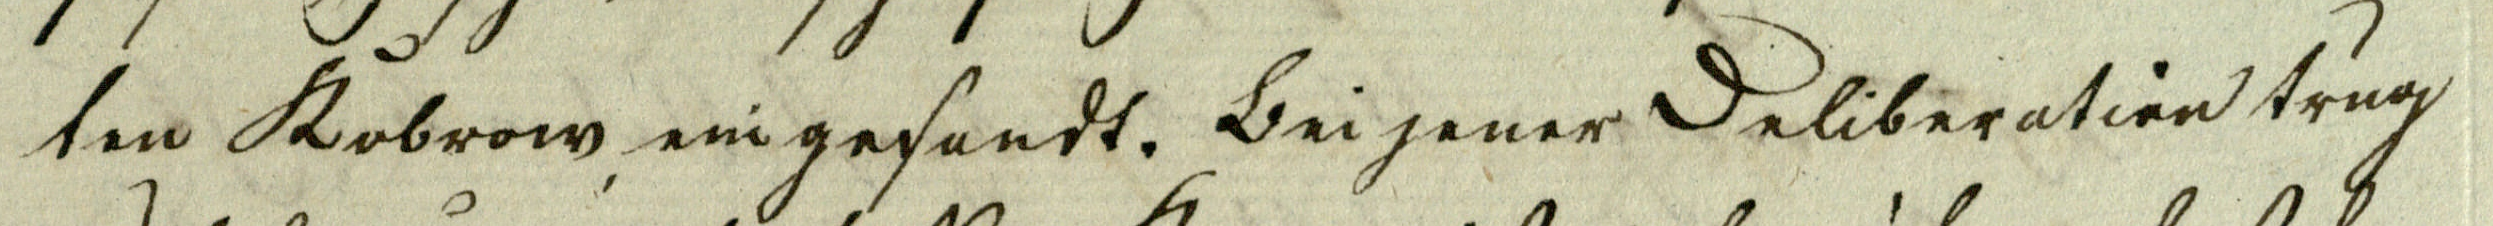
ten Kobrow eingesandt. Bei jener Deliberation trug
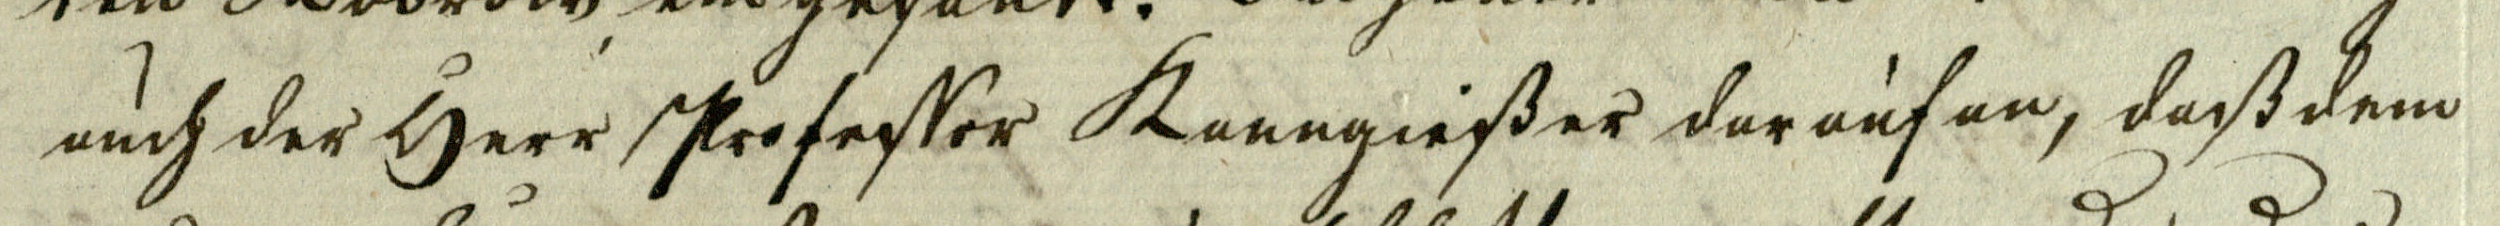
auch der Herr Professor Kanngießer darauf an, daß dem
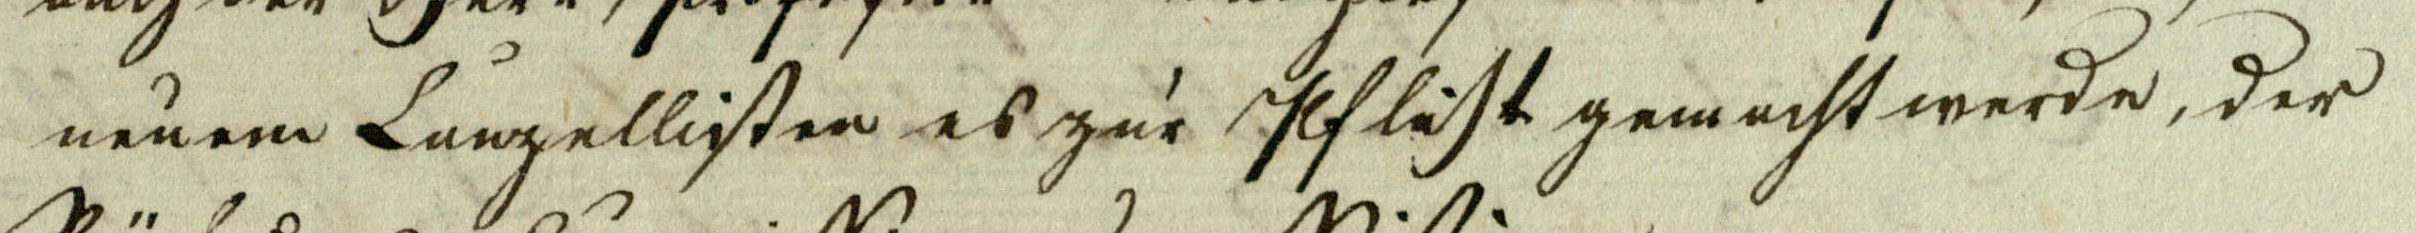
neuen Canzellisten es zur Pflicht gemacht werde, der
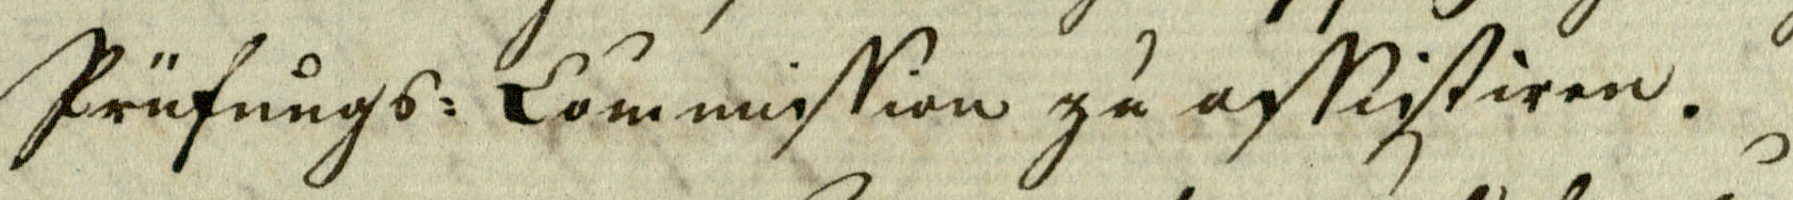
Prüfungs-Commission zu assistiren.
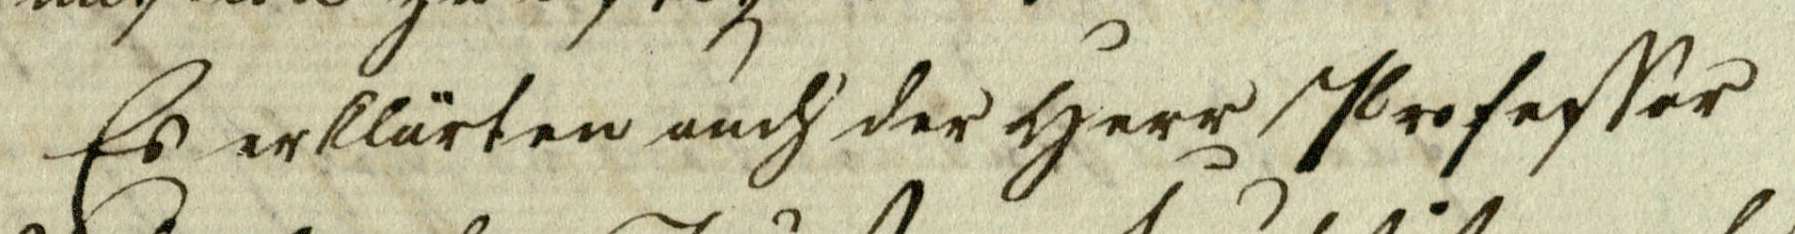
Es erklärten auch der Herr Professor
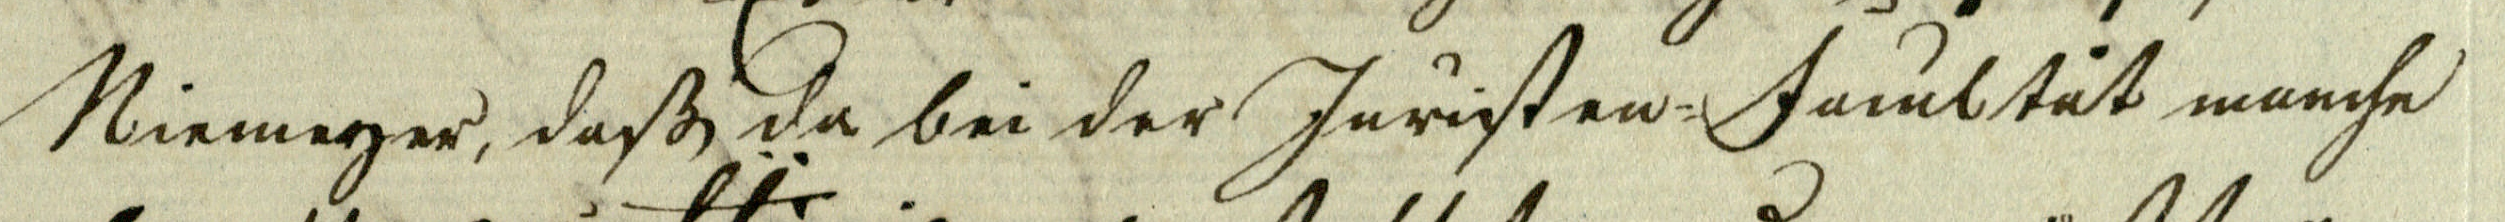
Niemeyer, daß da bei derJuristen-Facultät manche
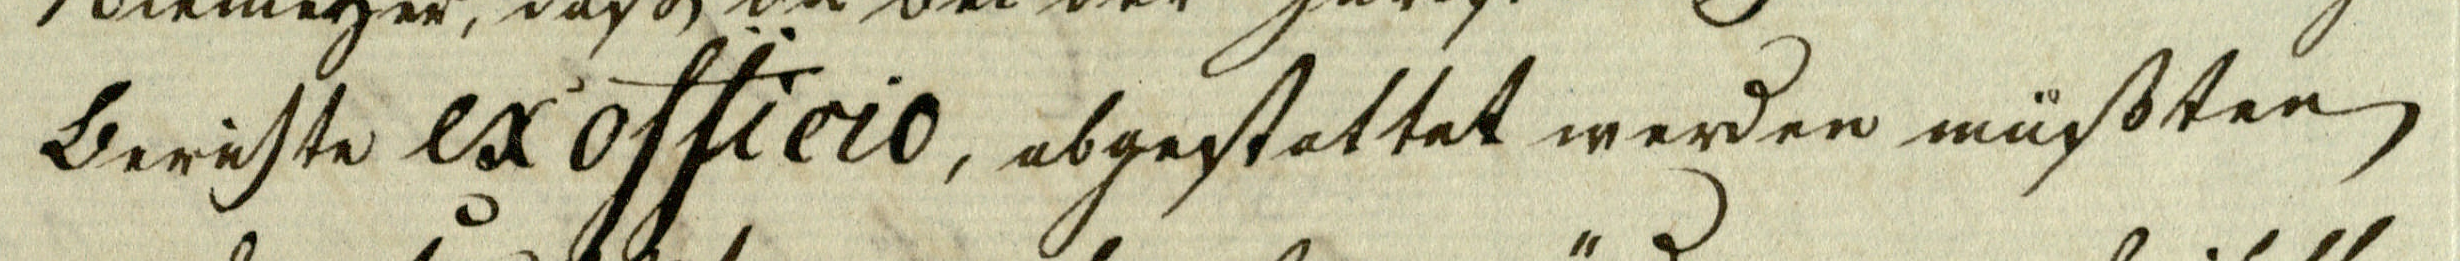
Berichte ex officio, abgestattet werden müßten,
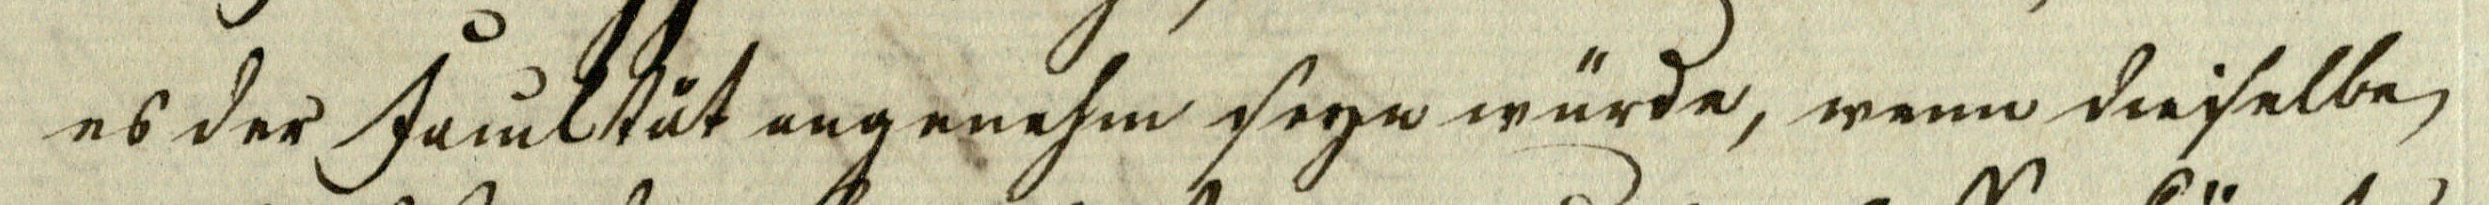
es der Facultät angenehm seyn würde, wenn dieselbe
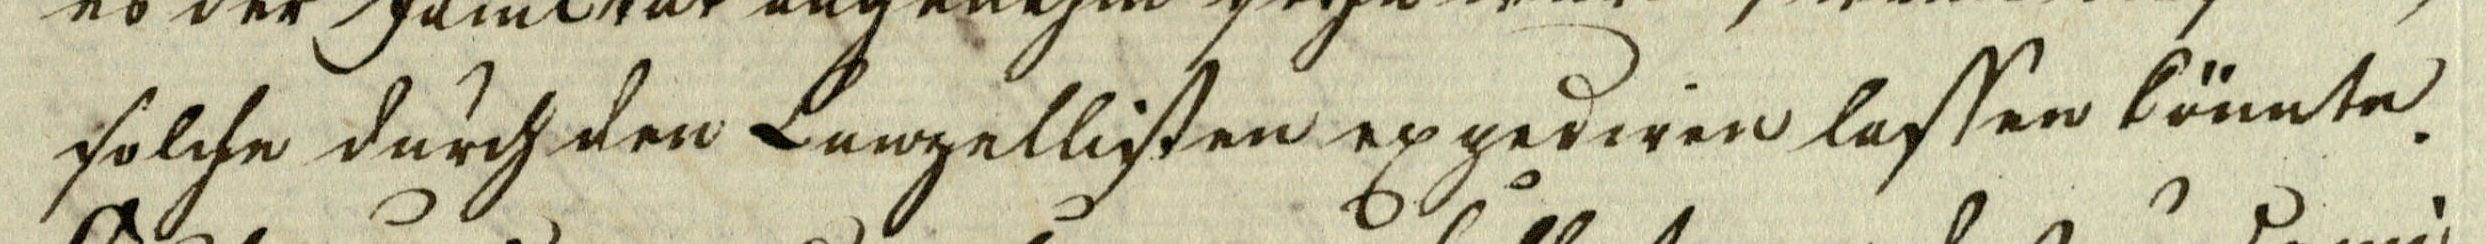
solche durch den Canzellisten expediren lassen könnte.
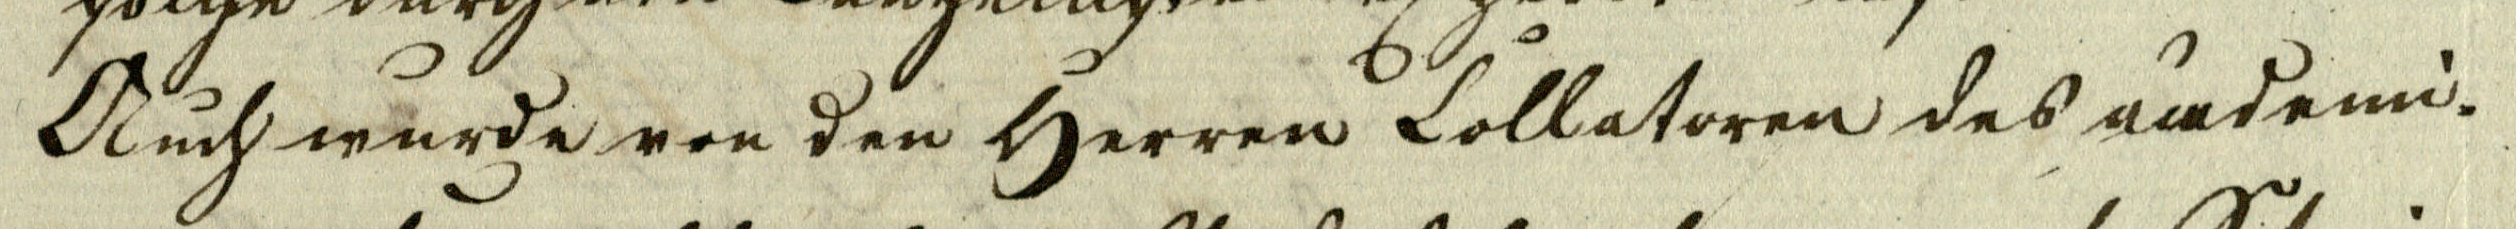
Auch wurde von den Herren Collatoren des academi¬
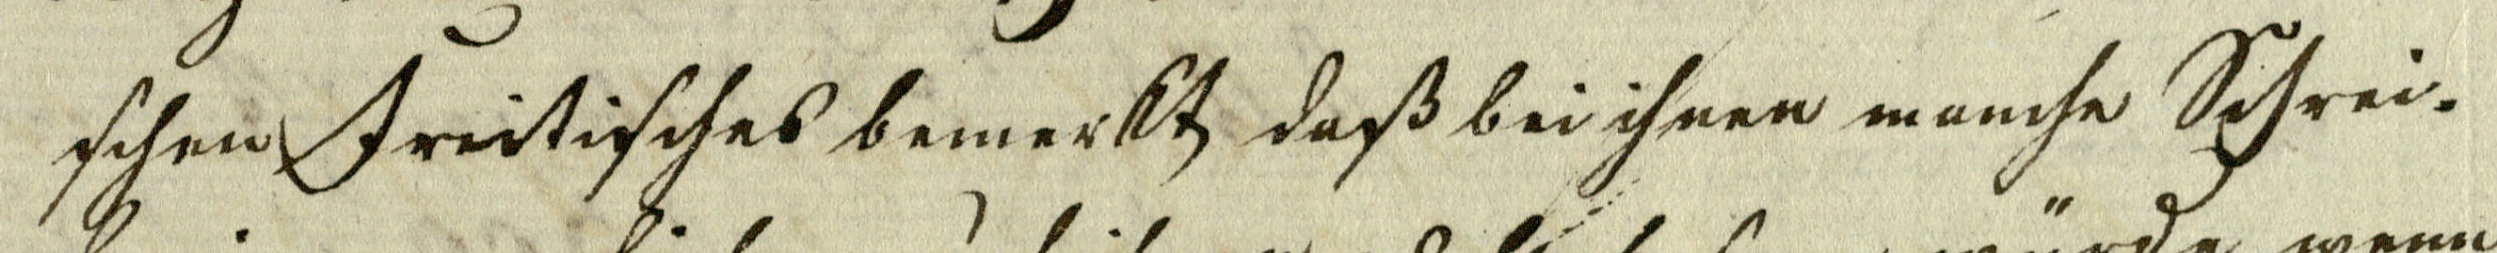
schen Freitisches bemerkt, daß bei ihnen manche Schrei¬
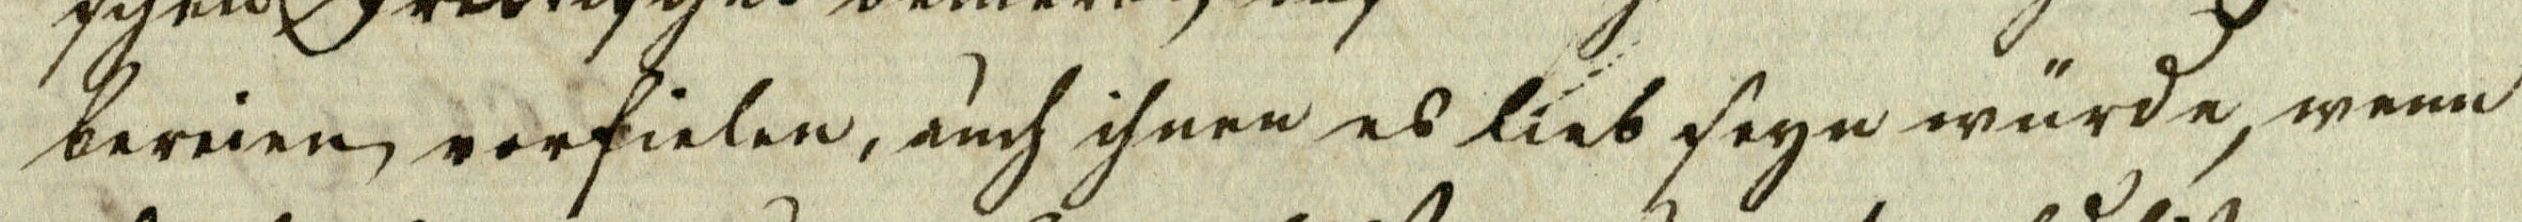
bereien vorfielen, auch ihnen es lieb seyn würde, wenn
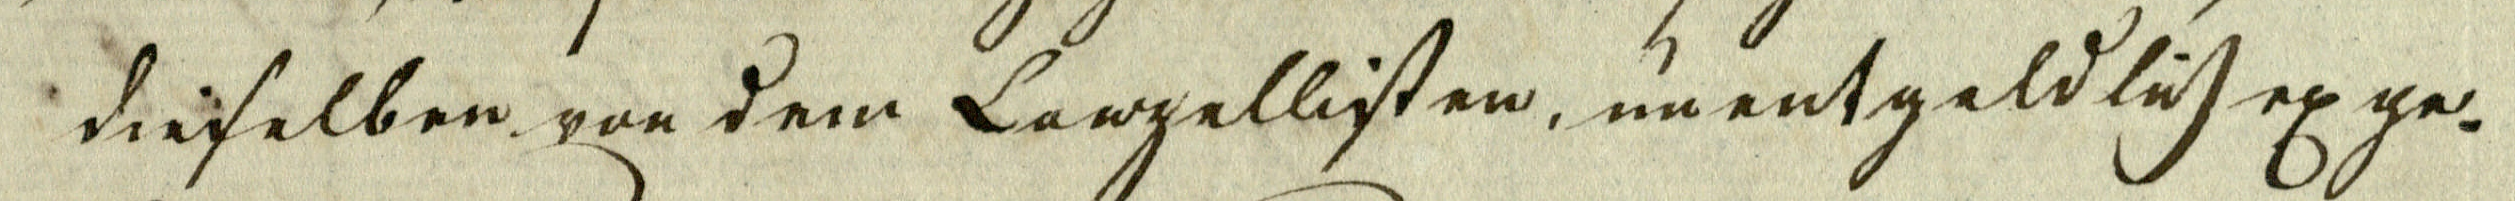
dieselben von dem Canzellisten, unentgeldlich expe¬
